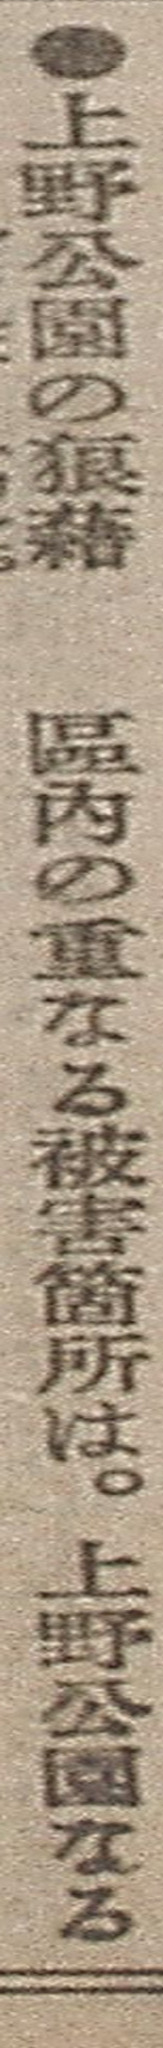●上野公園の狼藉区内の重なる被害箇所は。上野公園なる
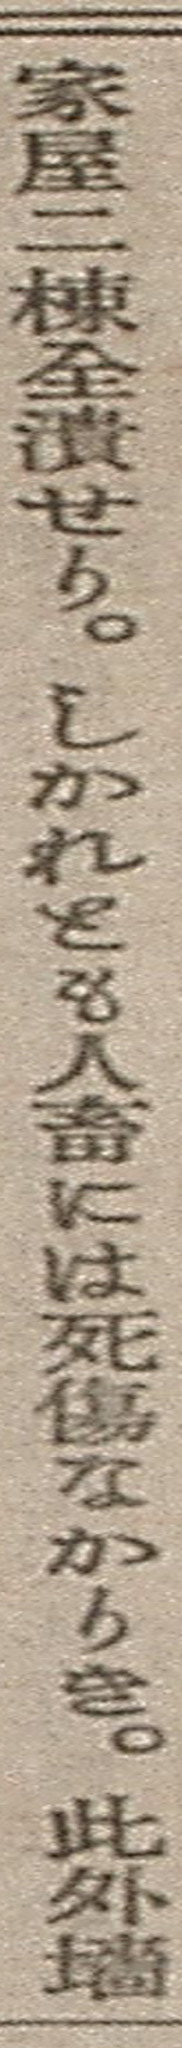家屋二棟全潰せり。しかれとも人畜には死傷なかりき。此外墻
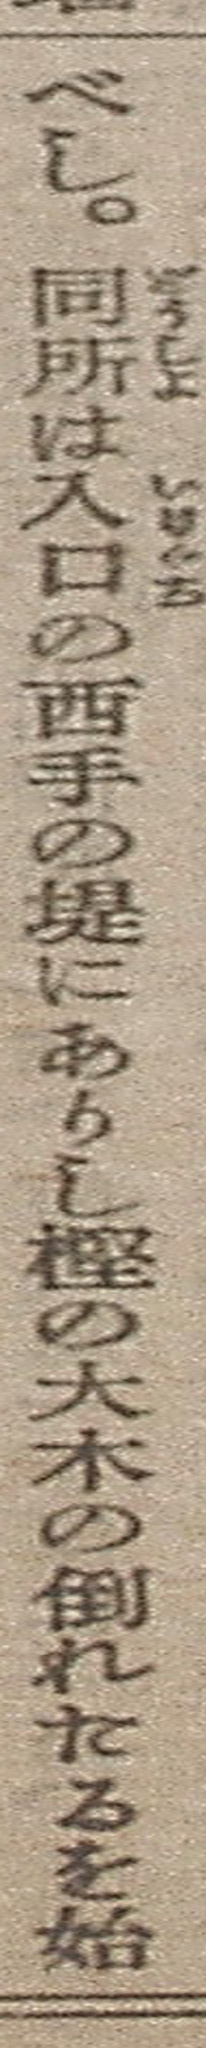べし。同所は入口の西手の堤にありし樫の大木の倒れたるを始
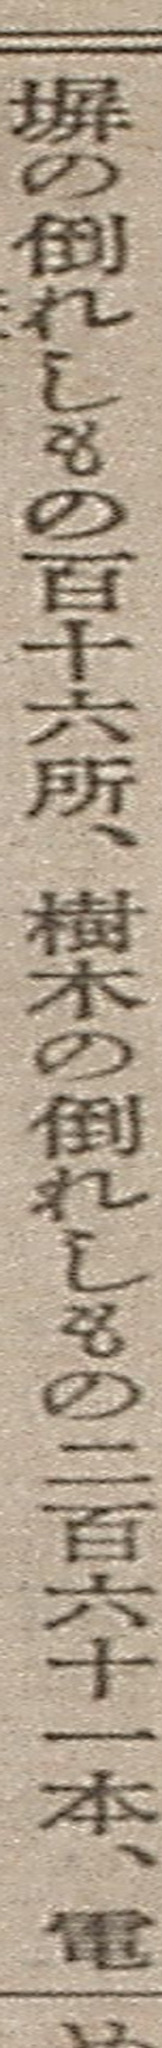塀の倒れしもの百十六ケ所、樹木の倒れしもの二百六十一本、電
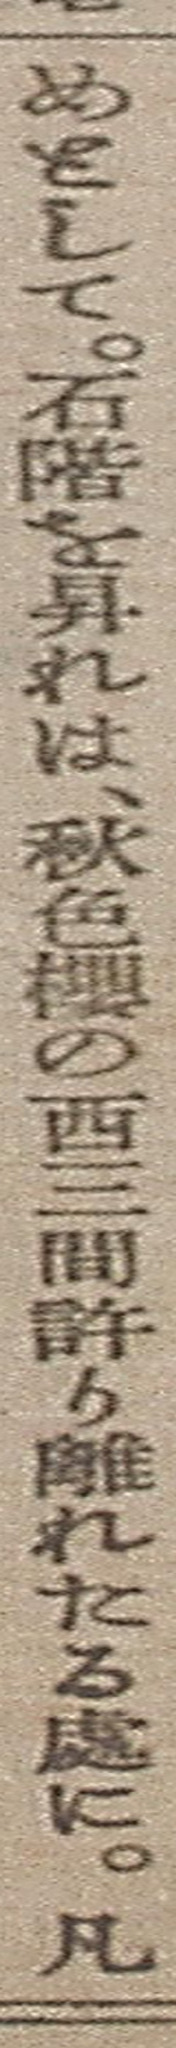めとして。石階を昇れは、秋色桜の西三間許り離れたる処に。凡
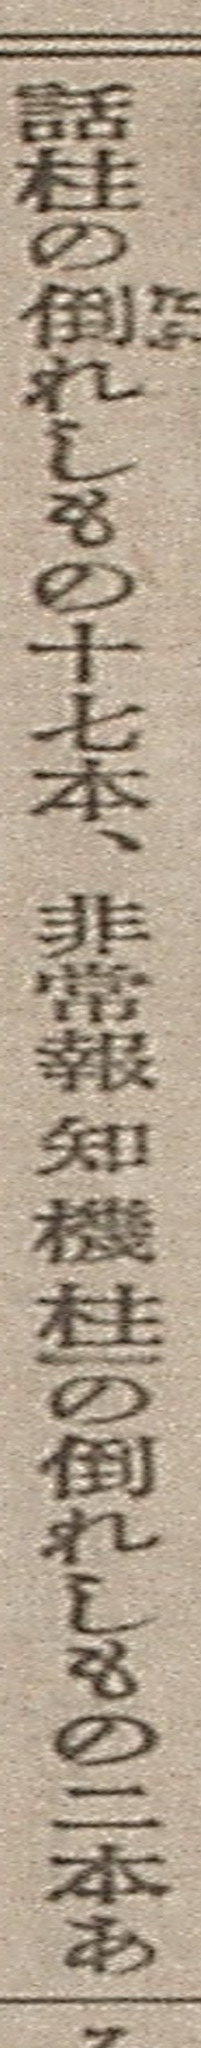話柱の倒れしもの十七本、非常報知機柱の倒れしもの二本あ
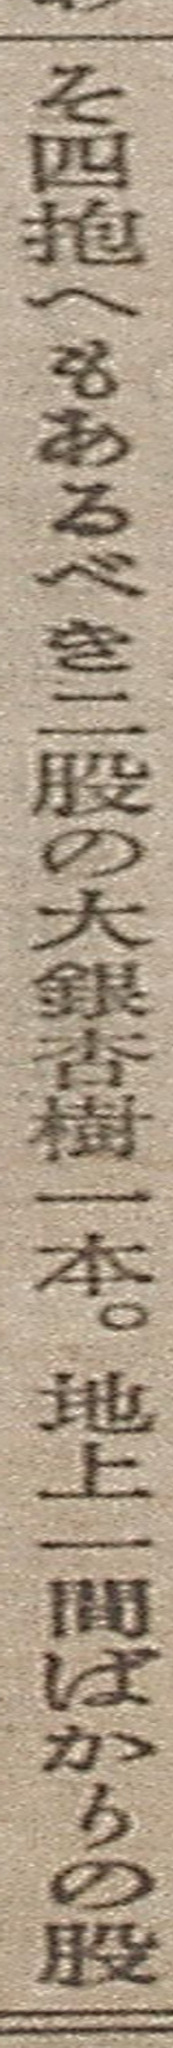そ四抱へもあるべき二股の大銀杏樹一本。地上一間ばかりの股
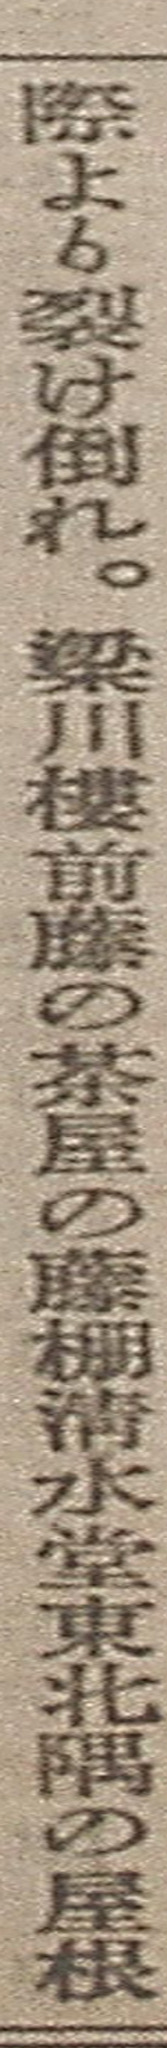際より裂け倒れ。梁川楼前藤の茶屋の藤棚清水堂東北隅の屋根
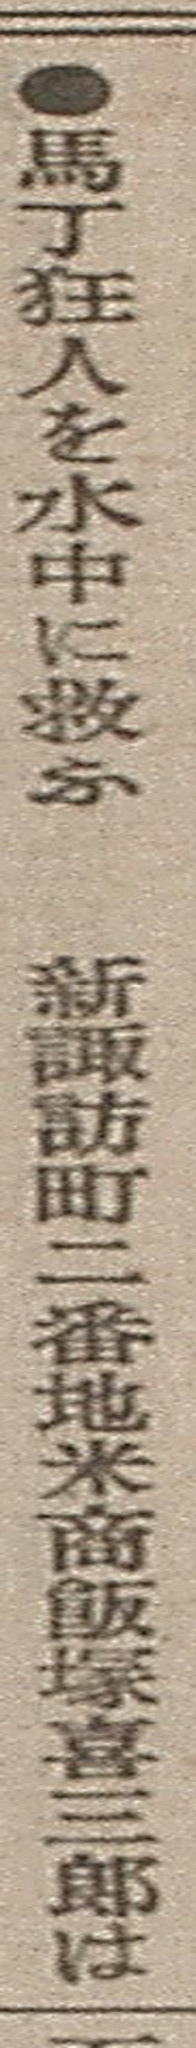●馬丁狂人を水中に救ふ新諏訪町二番地米商飯塚喜三郎は
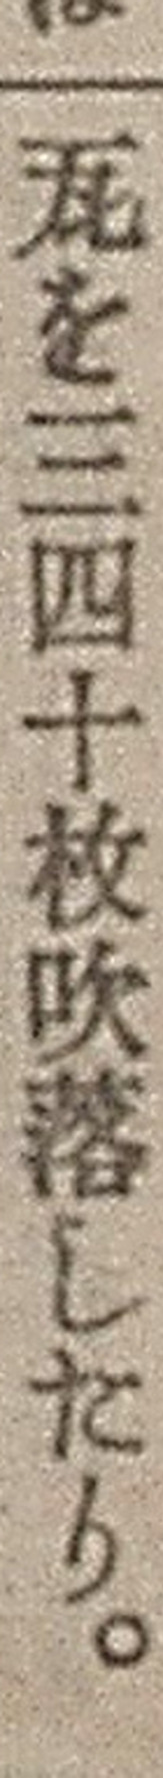瓦を三四十枚吹落したり。
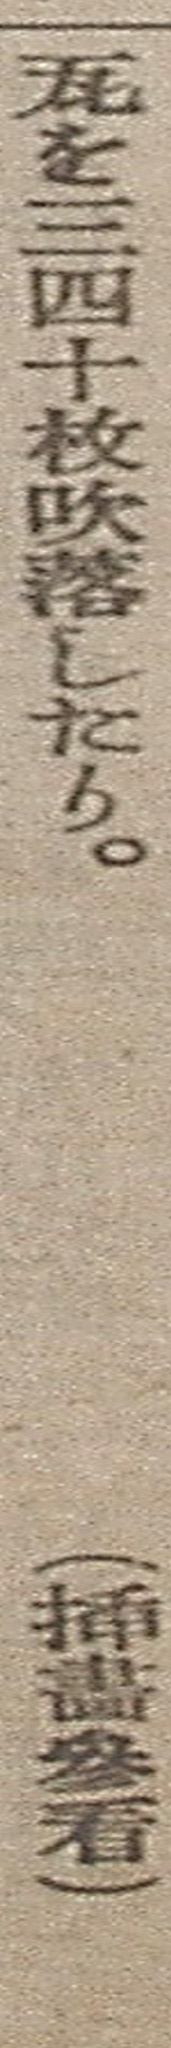瓦を三四十枚吹落したり。
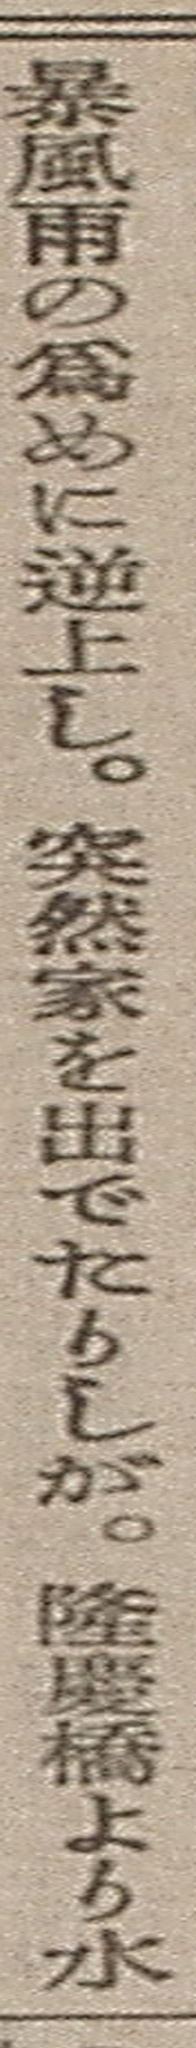暴風雨の為めに逆上し。突然家を出でたりしが。隆慶橋より水
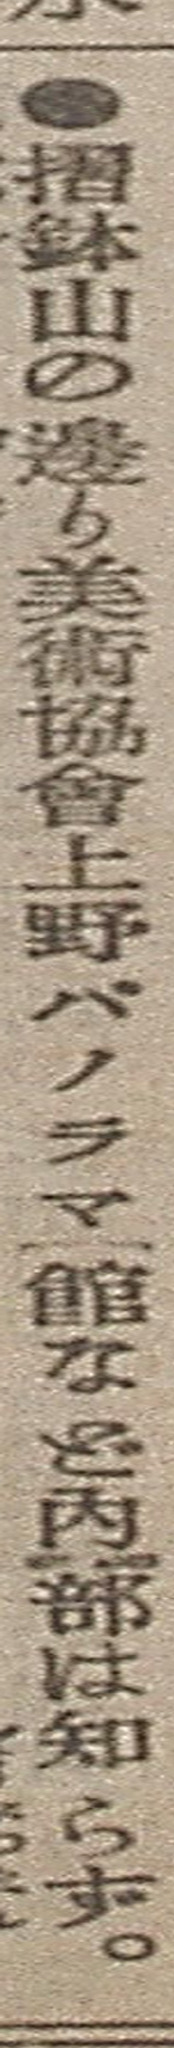●摺鉢山の辺り美術協会上野パノラマ館など内部は知らず。
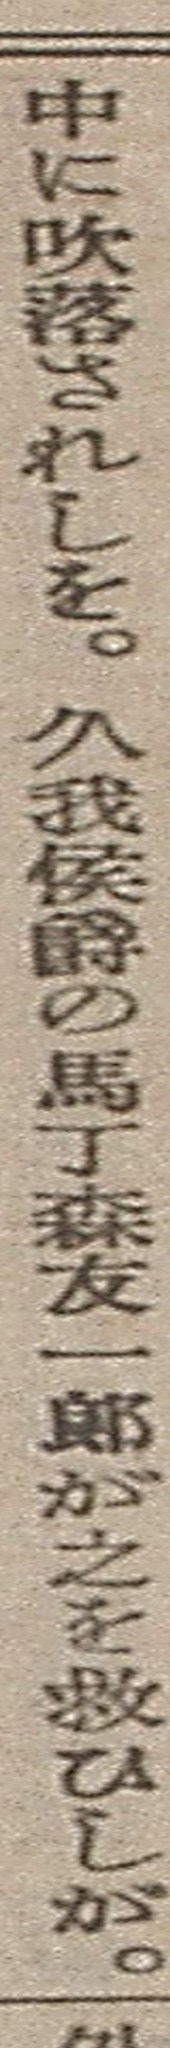中に吹落されしを。久我侯爵の馬丁森友一郎が之を救ひしが。
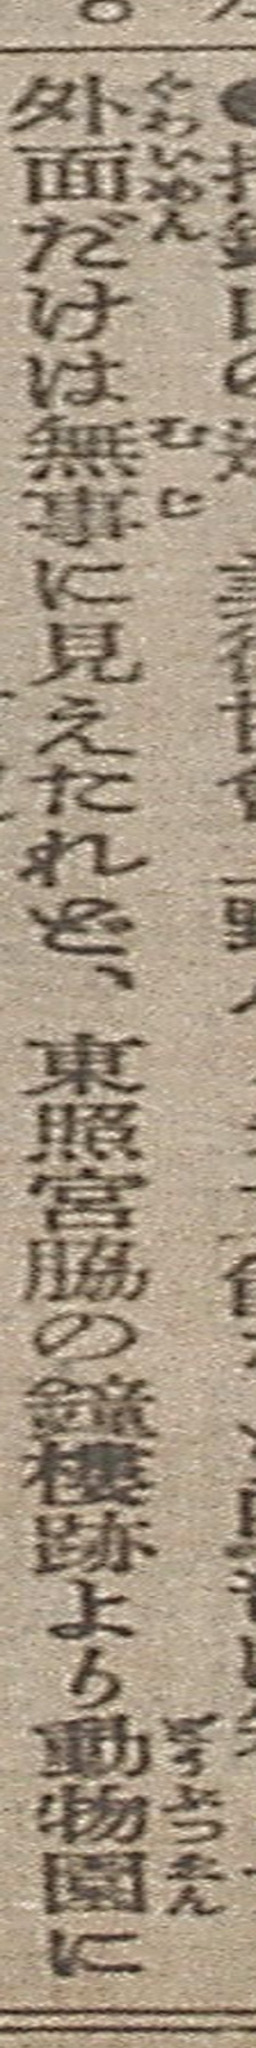外面だけは無事に見えたれど、東照宮脇の鐘楼跡より動物園に
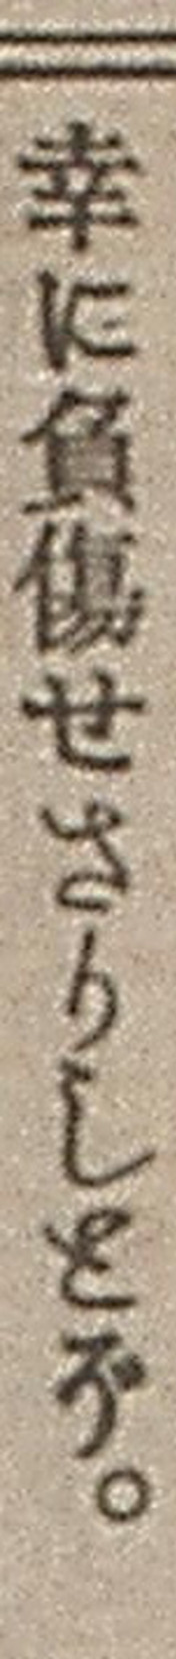幸に負傷せさりしとぞ。
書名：風俗畫報臨時増刊第百九十九號　明治三十二年十月各地災害圖會（前編之續）
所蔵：東京大学地震研究所図書室 Earthquake Research Institute Library, The University of Tokyo, JAPAN
